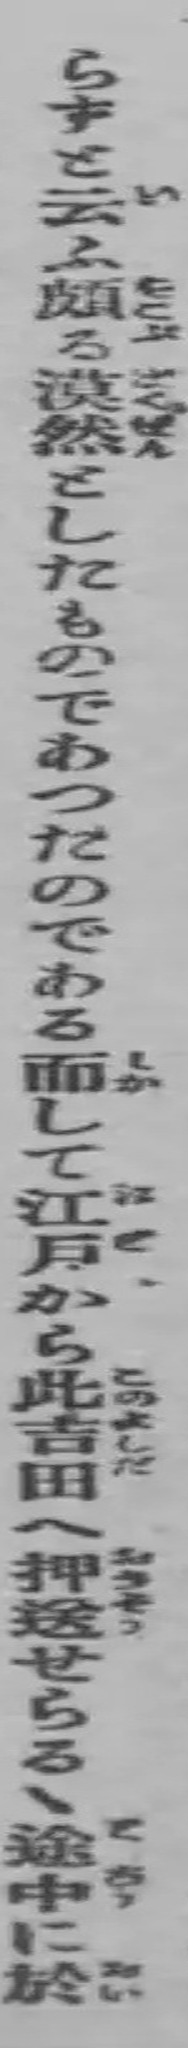らずと云ふ頗る漠然としたものであつたのである而して江戸から此吉田へ押送せらるゝ途中に於
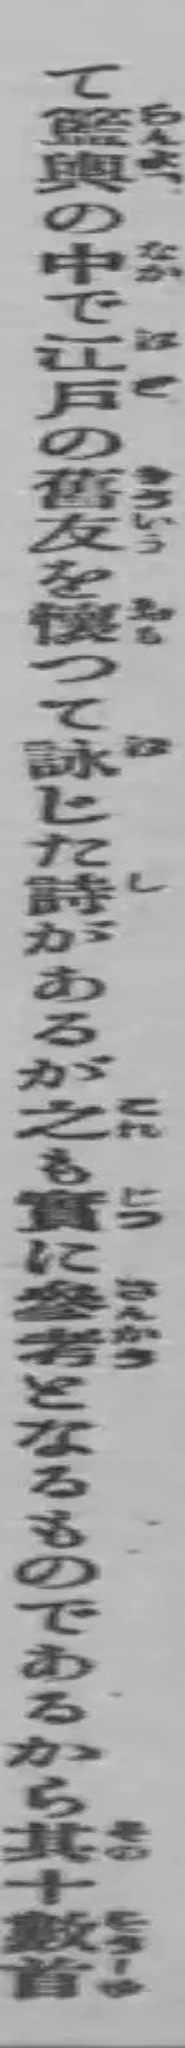て藍輿の中で江戸の旧友を懐つて詠じた詩があるが之も実に参考となるものであるから其十数首
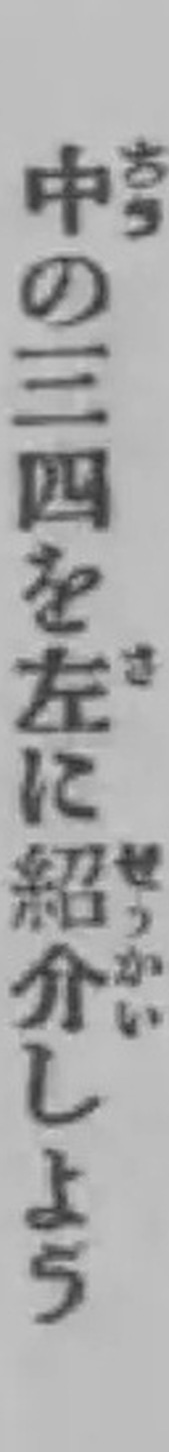中の三四を左に紹介しよう
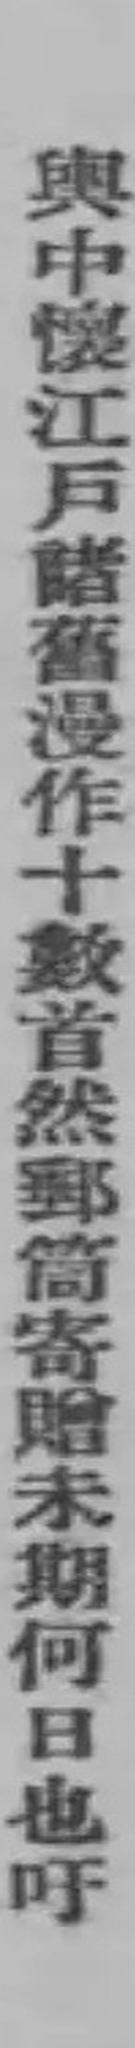輿中懐江戸諸旧漫作十数首然郵筒寄贈未期何日也吁
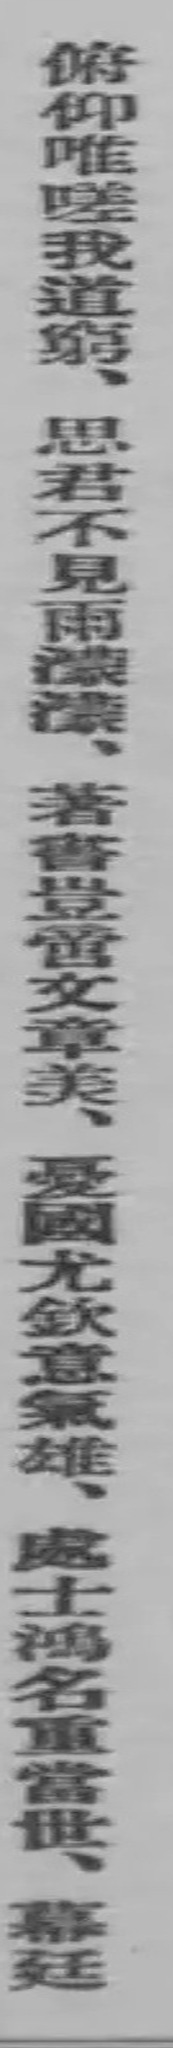俯仰唯嗟我道窮、思君不見雨濛濛、著書豈啻文章美、憂国尤欽意気雄、処士鴻名重当世、幕廷
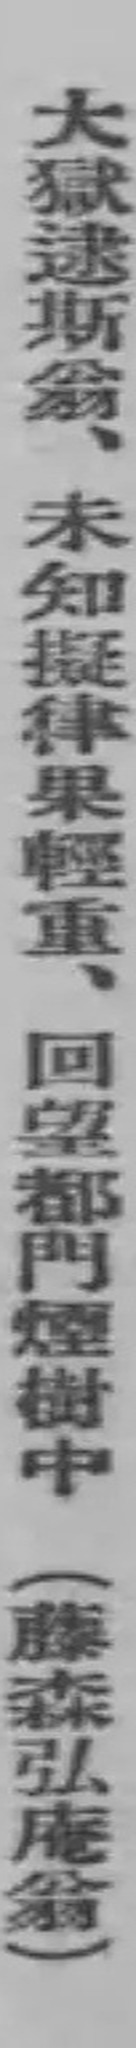大獄逮斯翁、未知擬律果軽重、回望都門煙樹中(藤森弘庵翁)
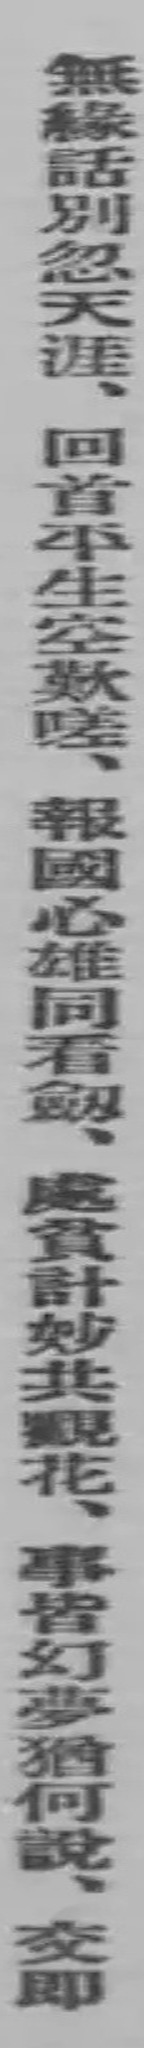無縁話別忽天涯、回首平生空歎嗟、報国心雄同看釼、処貧計妙共観花、事皆幻夢猶何説、交即
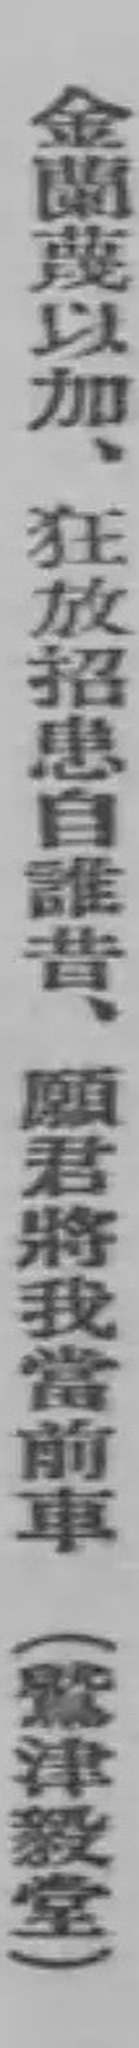金蘭蔑以加、狂放招患自誰昔、願君将我当前車(鷲津毅堂)
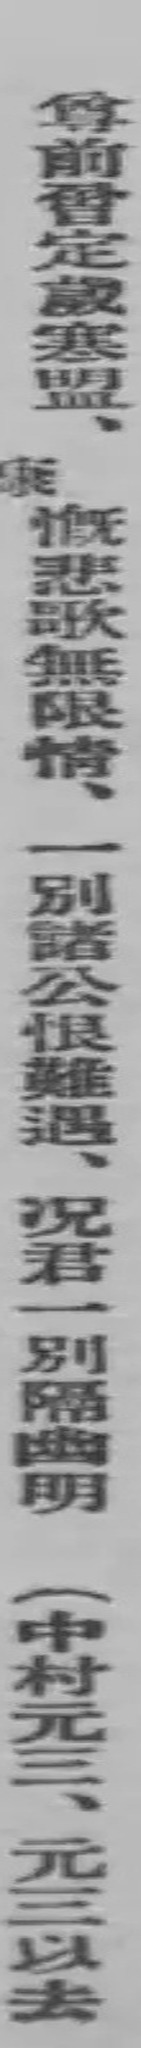尊前曾定歳寒盟、康概悲歌無限情、一別諸公恨難遇、況君一別隔幽明(中村元三、元三以去
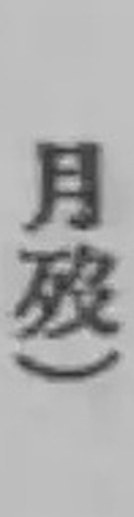月歿)
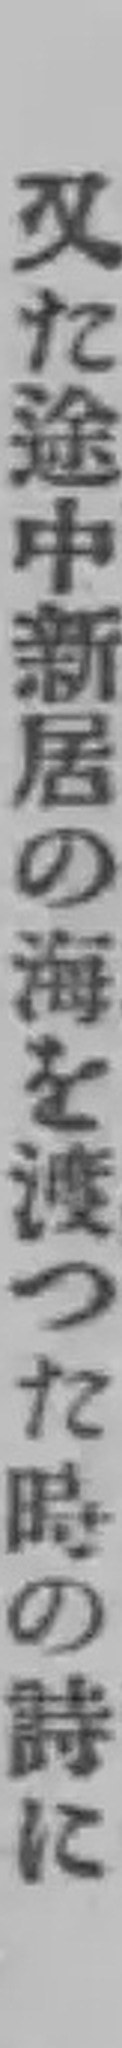又た途中新居の海を渡つた時の詩に
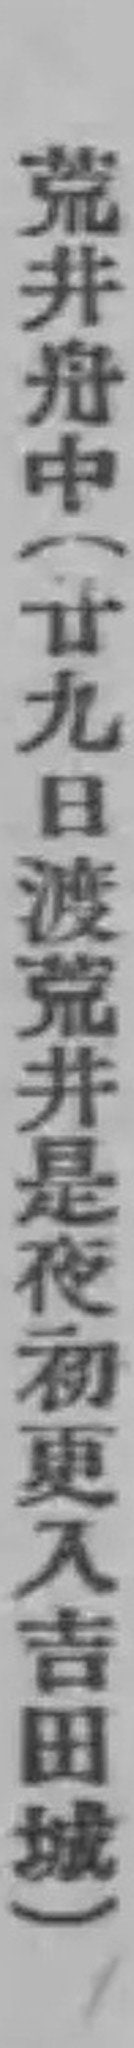荒井舟中(廿九日渡荒井是夜初更入吉田城)
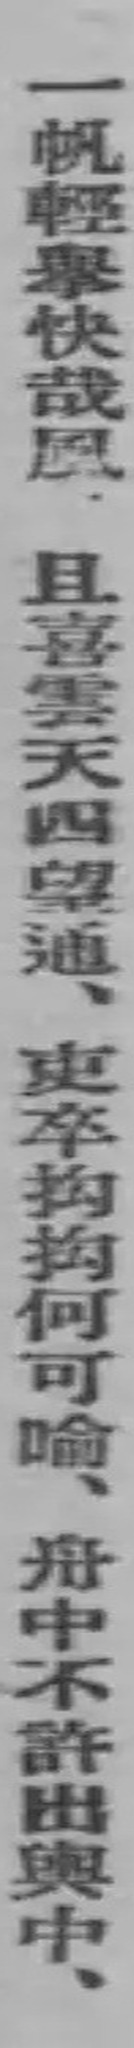一帆軽挙快哉風、且喜雲天四望通、吏卒抅抅何可喩、舟中不許出輿中、

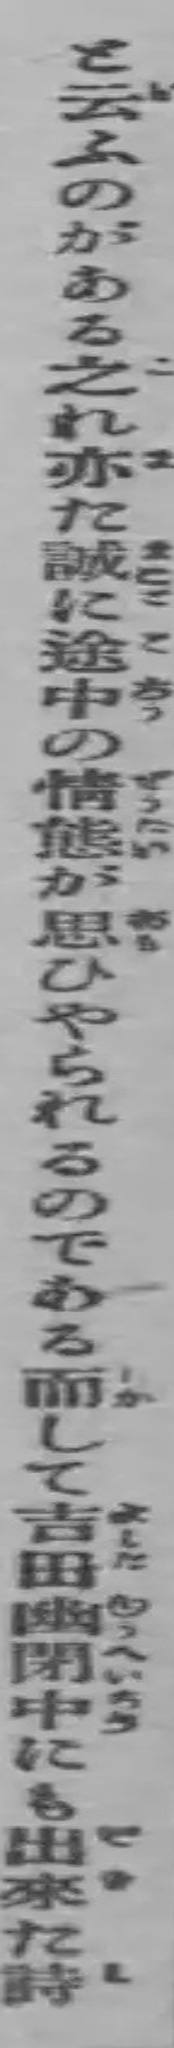と云ふのがある之れ亦た誠に途中の情態が思ひやられるのである而して吉田幽閉中にも出来た詩
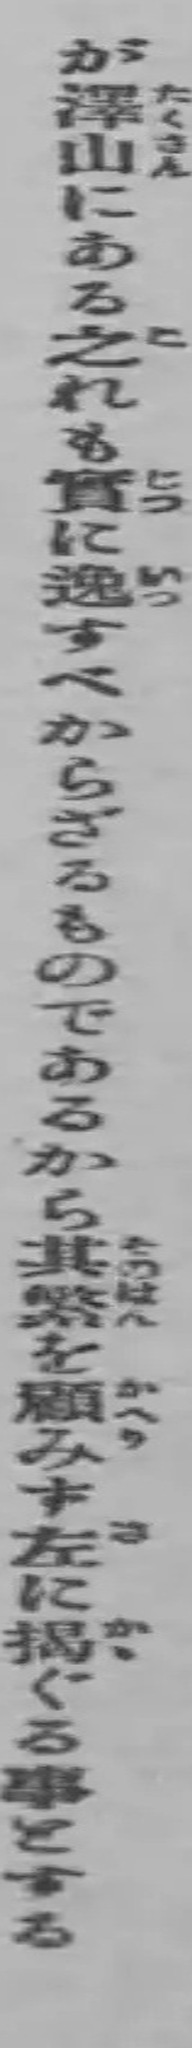が沢山にある之れも実に逸すべからざるものであるから其繁を顧みず左に掲ぐる事とする
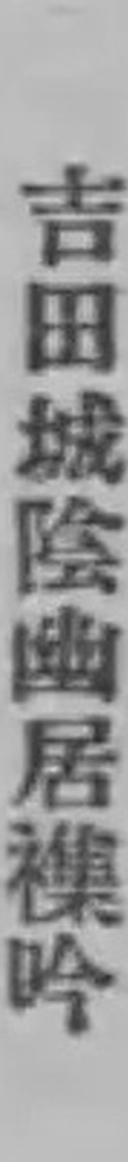吉田城陰幽居襍吟
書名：豊橋市史談
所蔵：国立国会図書館 National Diet Library, JAPAN
